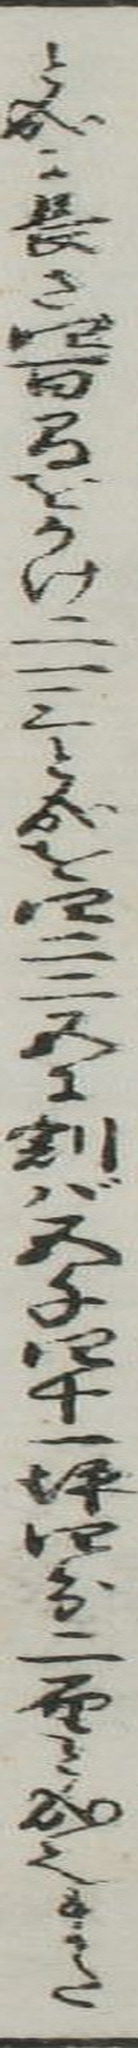と成に長さ四百間をかけ二一三と成を四二二五に割ば五千四十一坪四分二厘と成也また
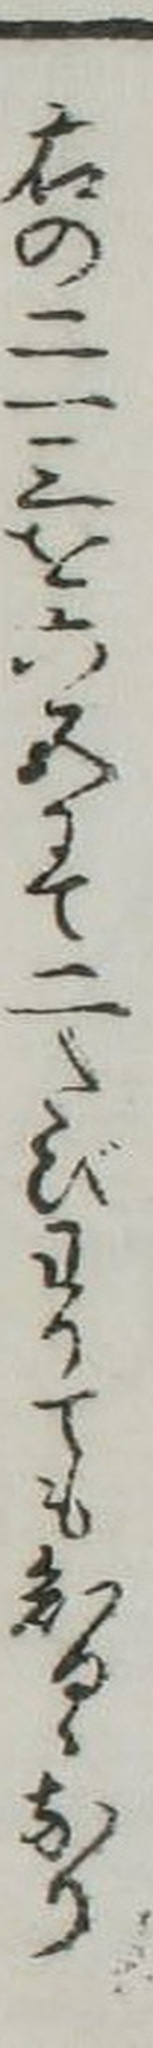右の二一三を六五にて二たびわりても知るゝなり
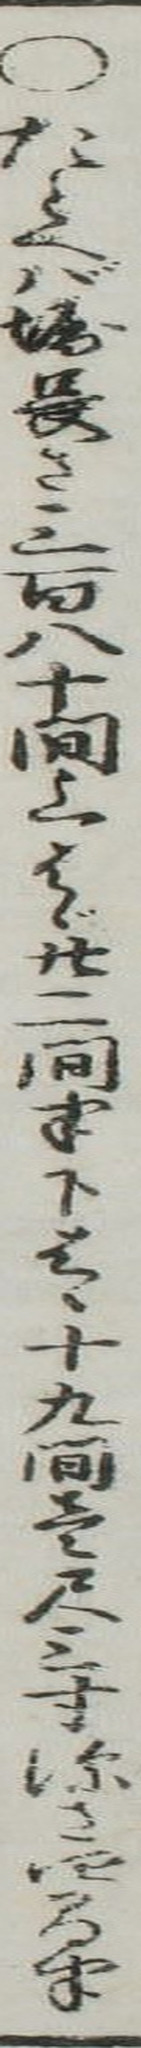○たとへば堀長さ三百八十間上はゞ廿二間半下はゝ十九間壱尺三寸深さ四間半
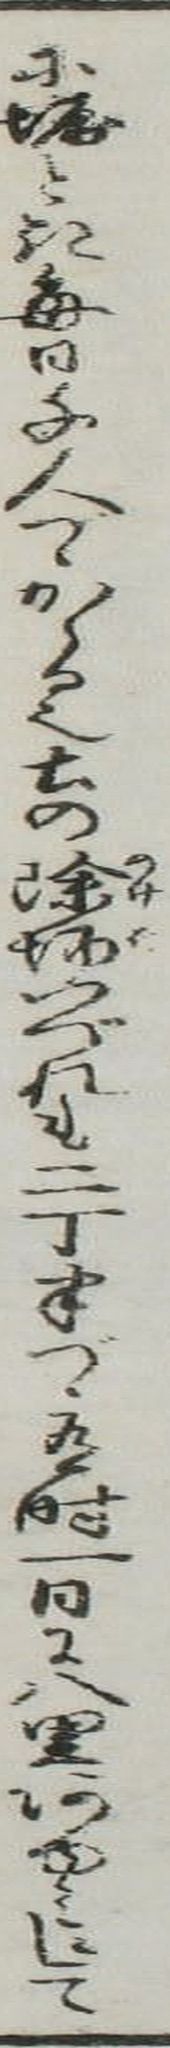に堀とき毎日千人づゝかゝる也土の除場いづれも二丁半づゝ有時一日に八里あゆみにして
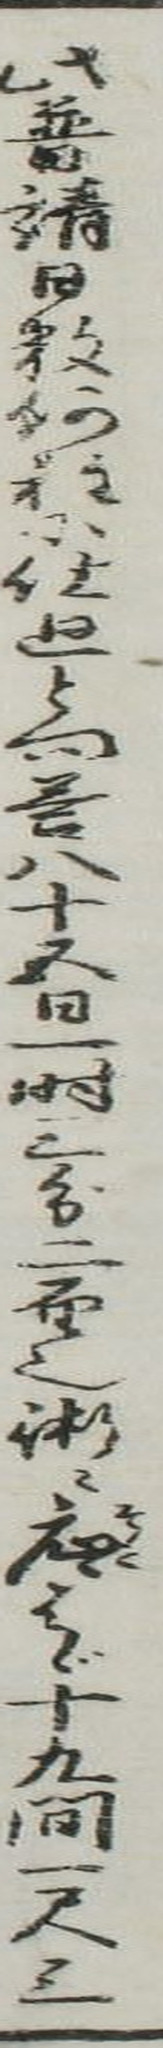此普請日数何程に仕廻と問答八十五日一時三分二厘也術に底はゞ十九間一尺三
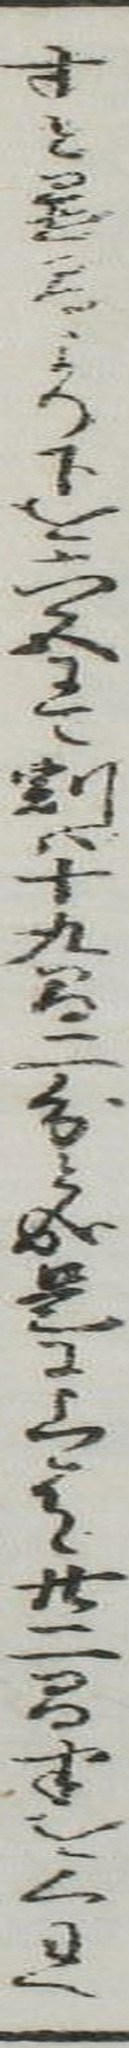寸と置間より下を六五にて割ば十九間二分と成是に上はゞ廿二間半をくわへ
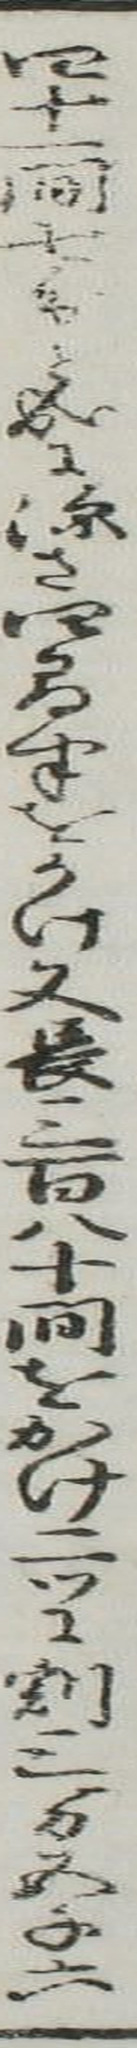四十一間七分と成に深さ四間半をかけ又長三百八十間をかけ二ツに割三万五千六
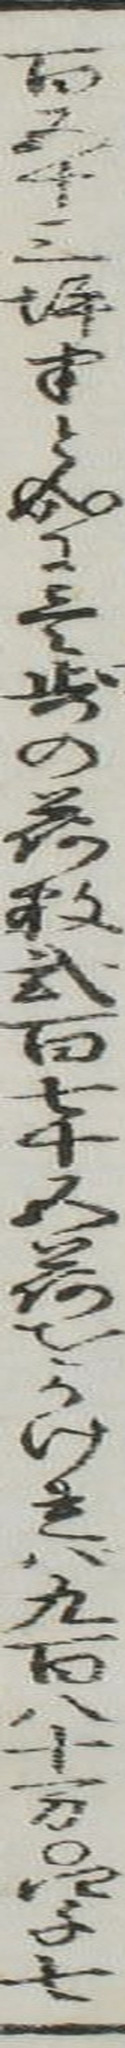百五十三坪半と成に壱歩の荷数弐百七十五荷をかければ九百八十万〇四千七
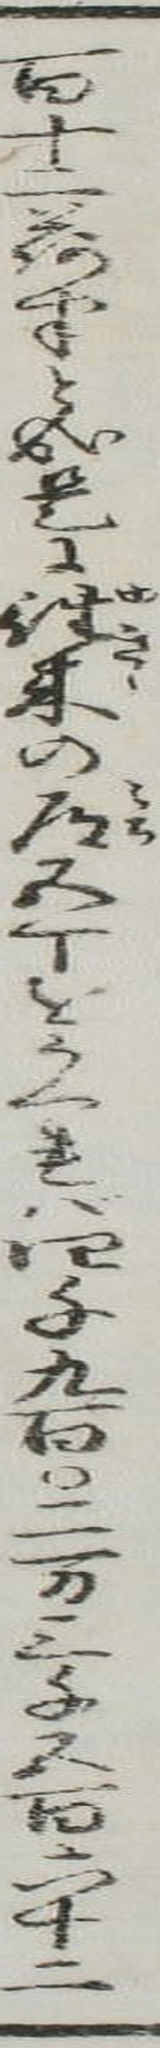百十二荷半と成是に往来の道五丁をかくれば四千九百〇二万三千五百六十二
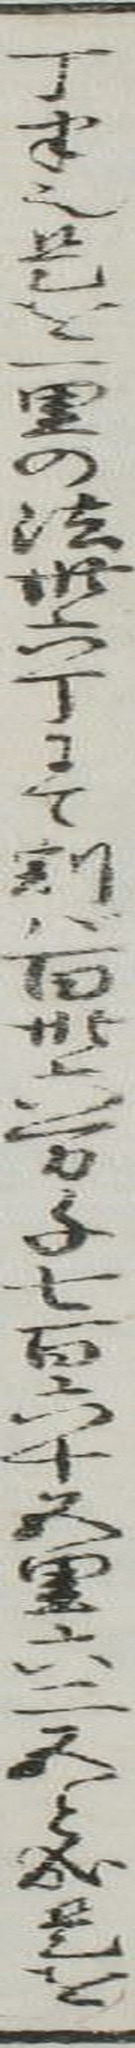丁半也是を一里の法卅六丁にて割ば百卅六万千七百六十五里六二五と成是を
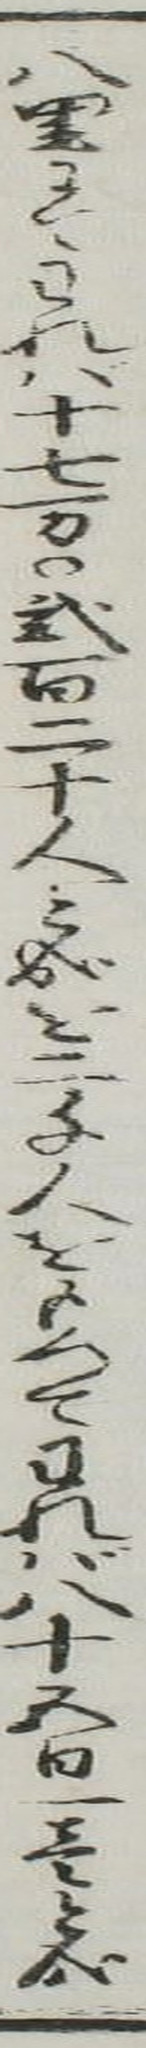八里にてわれば十七万〇弐百二十人と成を二千人をもつてわれば八十五日一壱と成
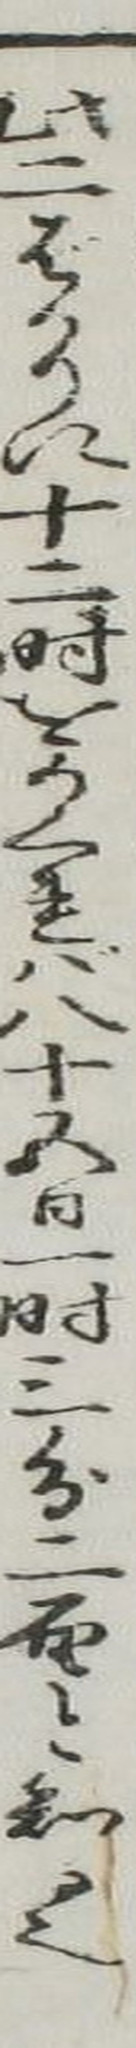此二ばかりに十二時をかくれば八十五日一時三分二厘と知る也
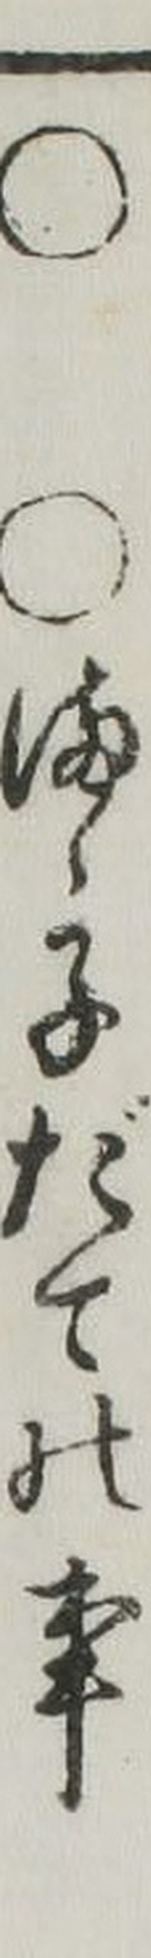○○まゝ子だての事
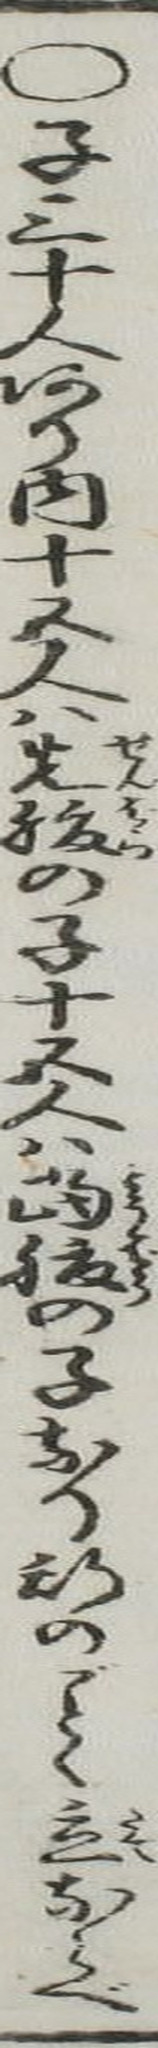○子三十人あり内十五人は先腹の子十五人は当腹の子なり斯のごとく立ならべ
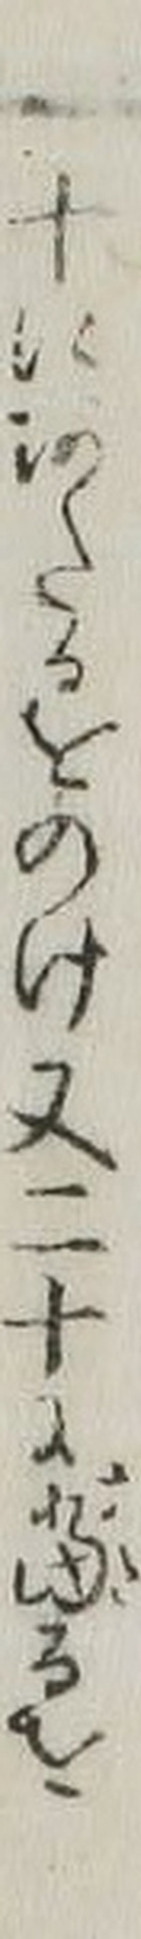十にあたるをのけ又二十に当るを
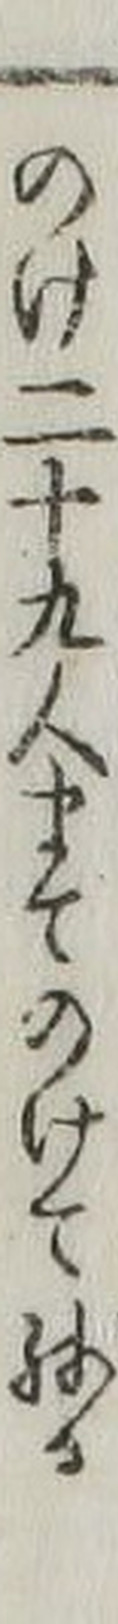のけ二十九人まてのけて残る
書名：宝玉塵劫記
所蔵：東京学芸大学教育コンテンツアーカイブ
